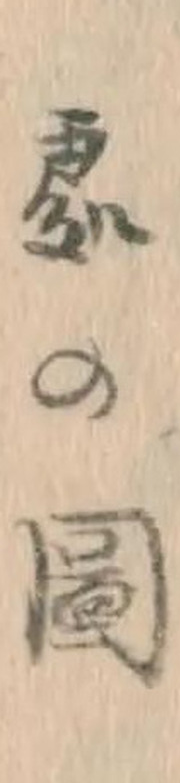処の図
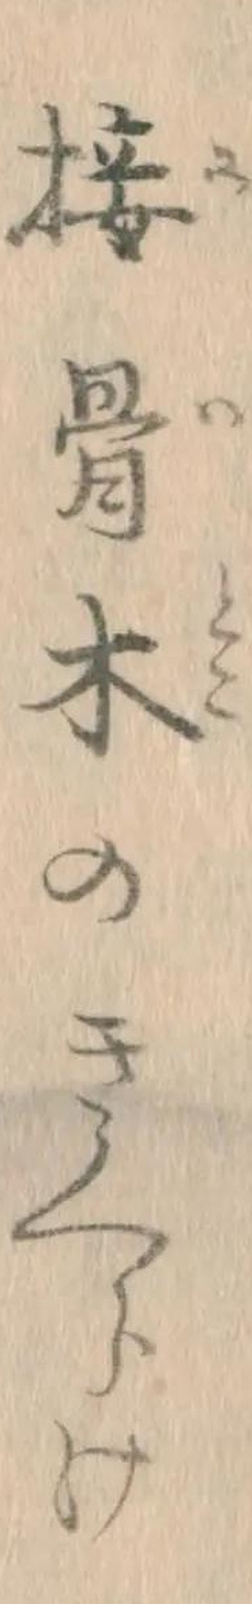接骨木のきくらけ
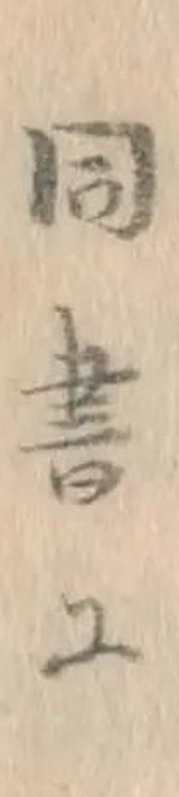同書に
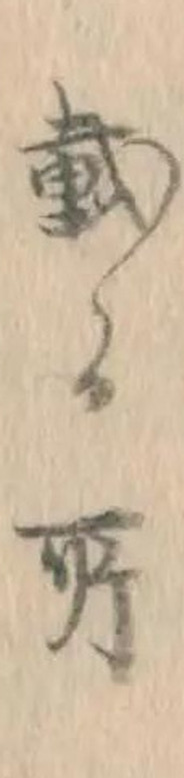載る所

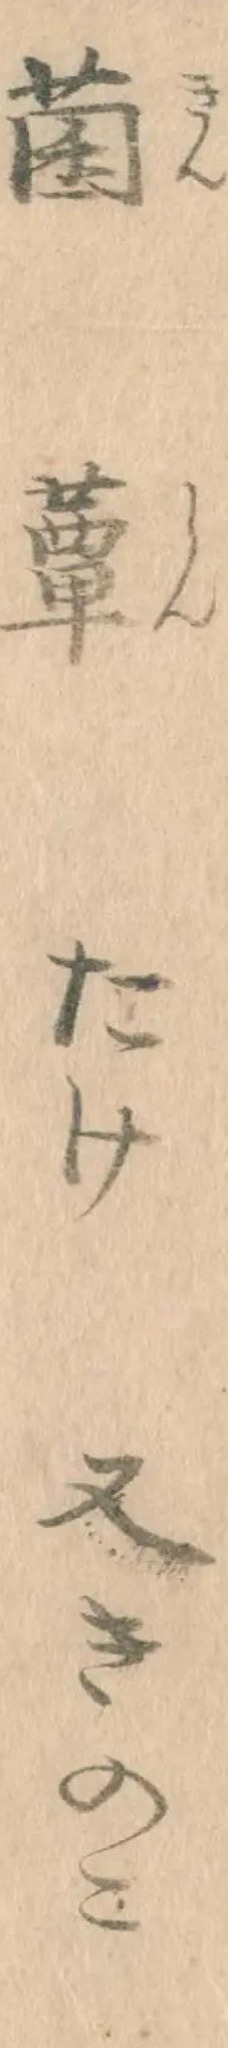菌蕈たけ又きのこ
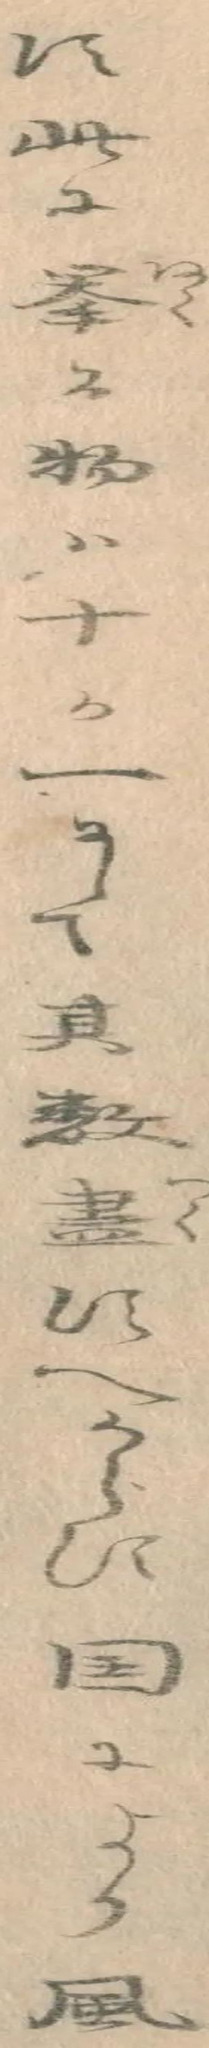す此に挙る物は十か一にして其数尽すへからす国により風
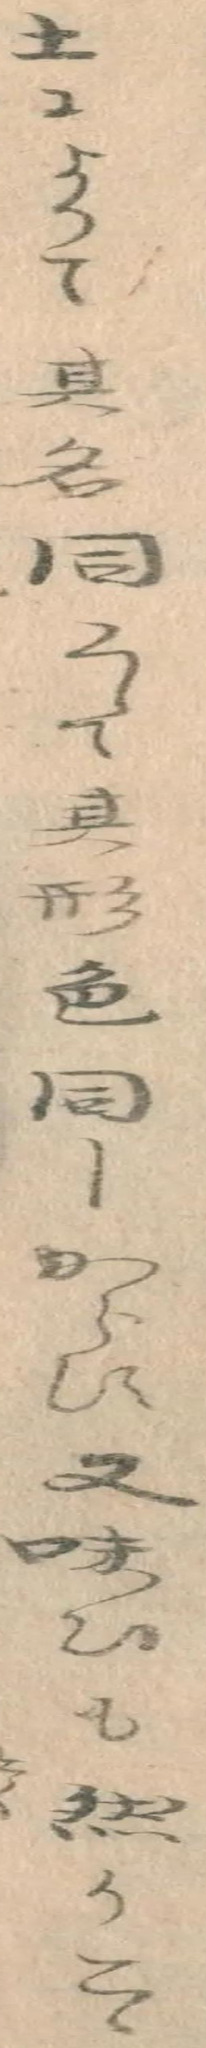土によりて其名同くして其形色同しからす又味ひも然りこゝ
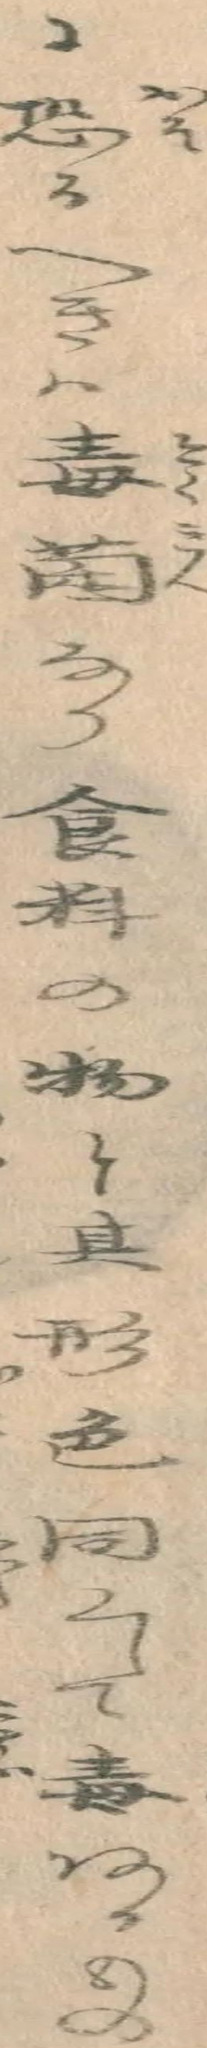に恐るへきは毒菌なり食料の物と其形色同くして毒あるもの
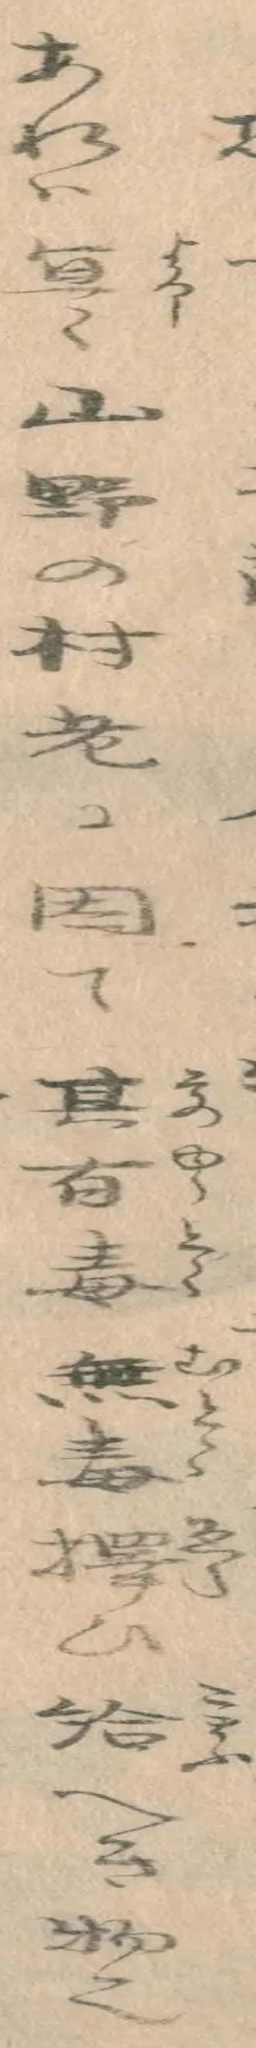あれは宜く山野の村老に因て其有毒無毒択ひ給へき物也
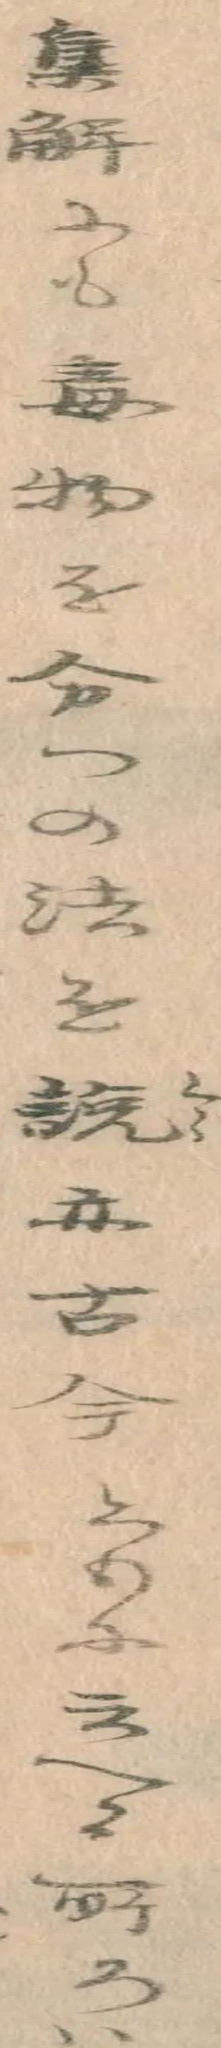集解にも毒物を分つの法を説亦古今ともに云へる所ろは
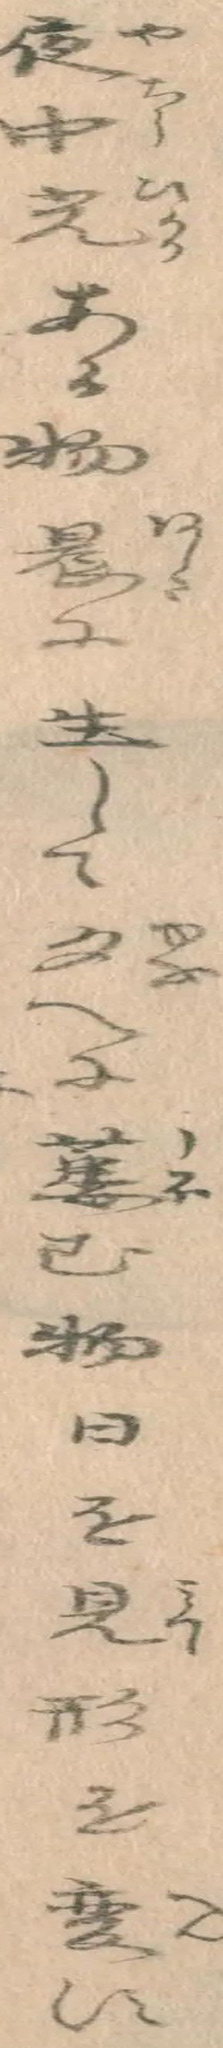夜中光ある物晨に生して夕へに蒌む物日を見形を変す
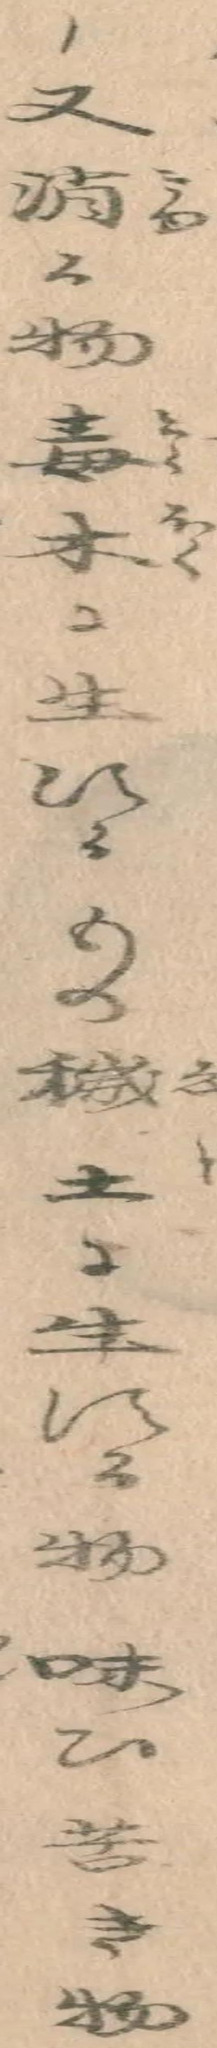し又消る物毒木に生するもの穢土に生する物味ひ苦き物
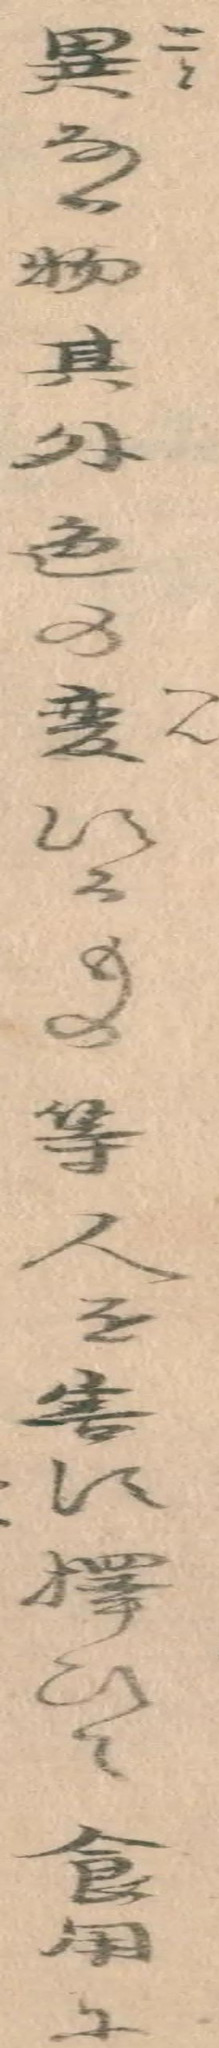異なる物其外色の変するもの等人を害す択ひて食用に
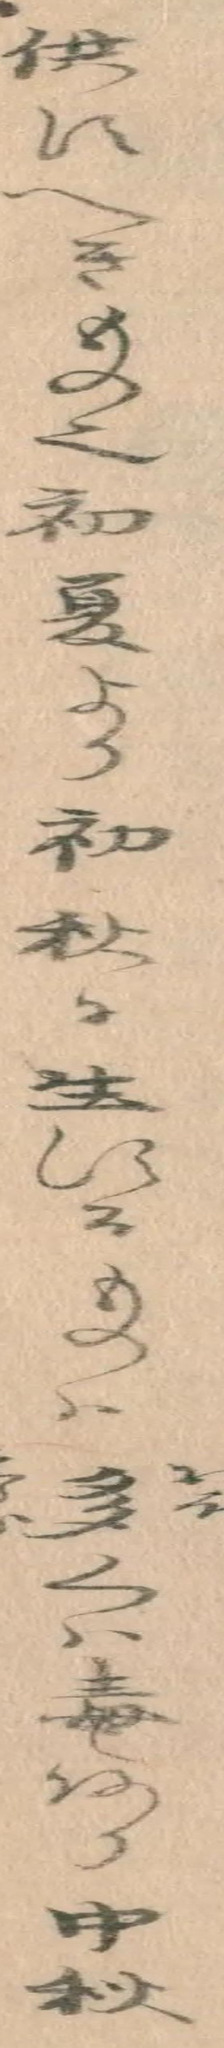供すへきもの也初夏より初秋に生するものは多くは毒あり中秋
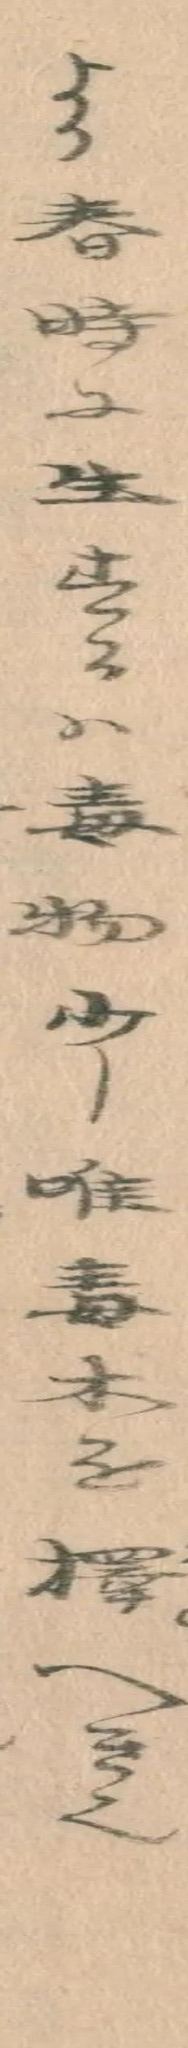より春時に生するは毒物少し唯毒木を択へき也
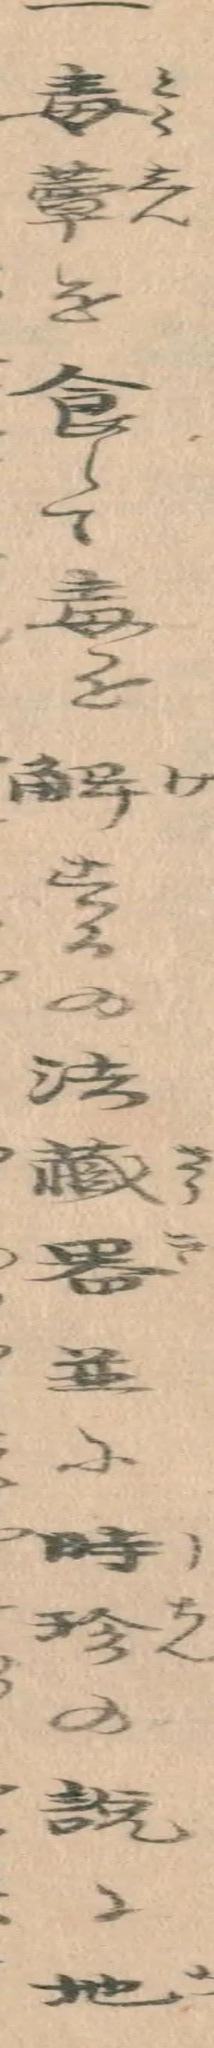一毒蕈を食して毒を解するの法蔵器並に時珍の説に地
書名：本草図譜. 巻55-57
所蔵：国立国会図書館 National Diet Library, JAPAN
